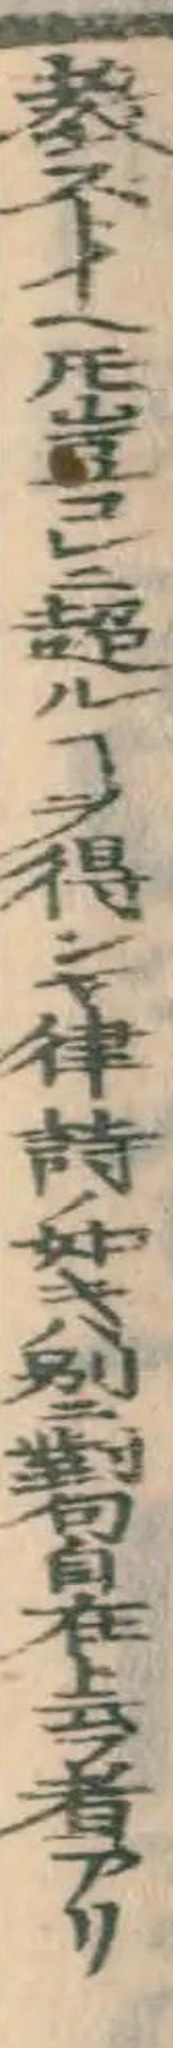教ストイヘトモ豈コレニ超ルコトヲ得ンヤ律詩ノ如キハ別ニ対句自在ト云フ者アリ
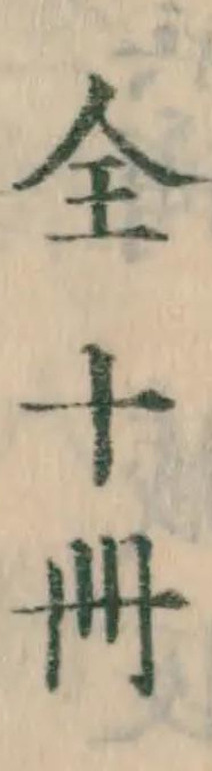全二冊
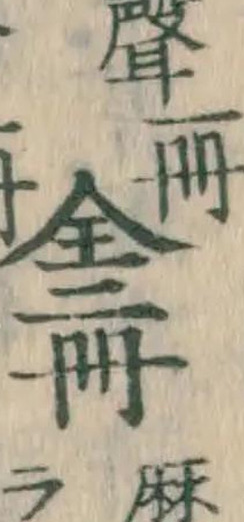全二冊
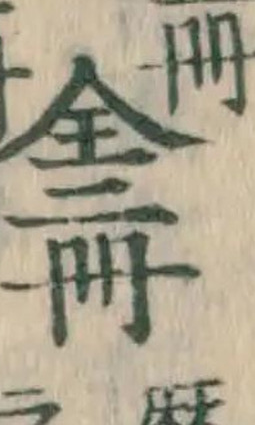全二冊
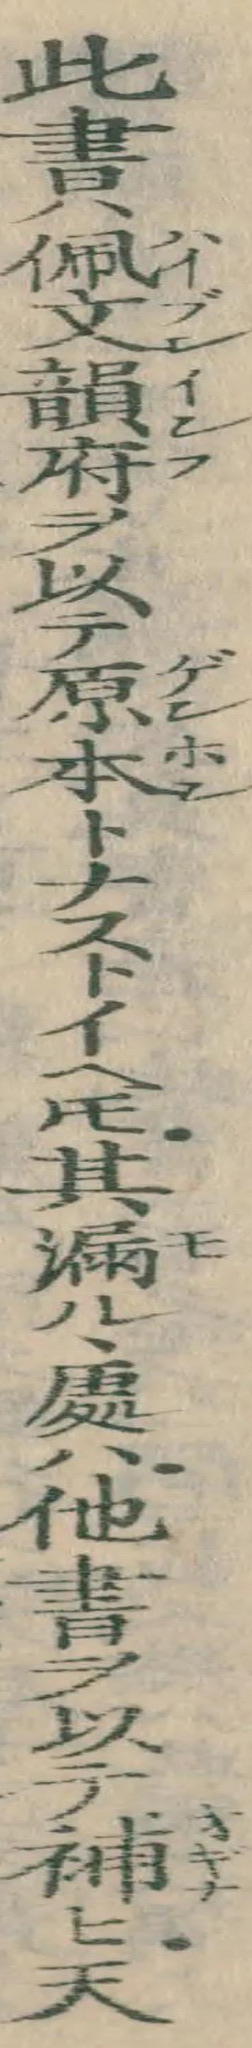此書ハ佩文韻府ヲ以テ原本トナストイヘトモ．其漏ルヽ処ハ．他書ヲ以テ補ヒ．天
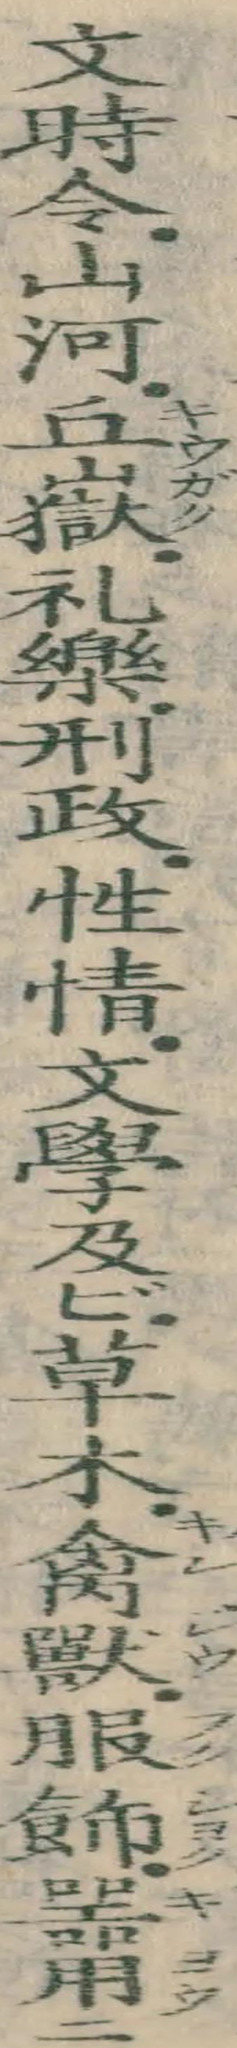文時令．山河．丘岳．礼楽．刑政．性情．文学及ビ．草木．禽獣．服飾．器用ニ
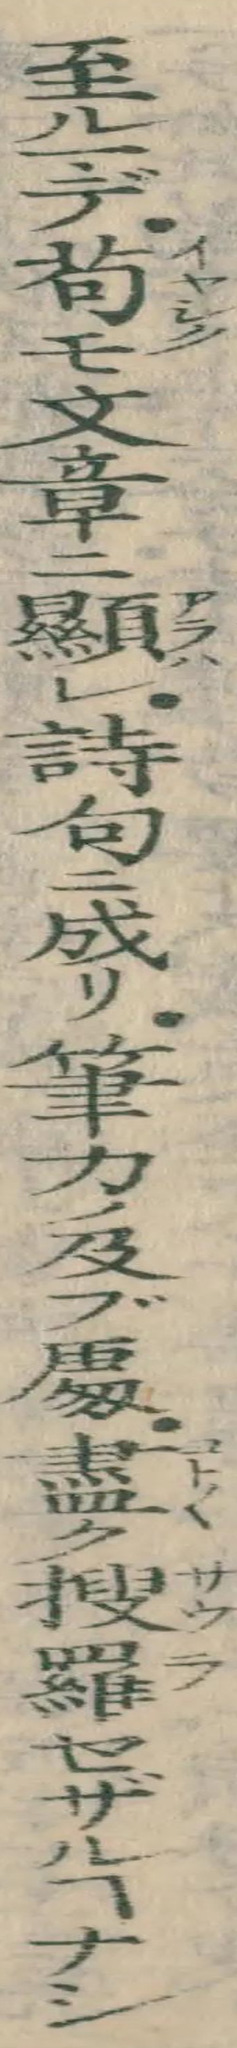至ルマデ．苟モ文章ニ顕レ．詩句ニ成リ．筆力ノ及ブ処．尽ク捜羅セザルコトナシ
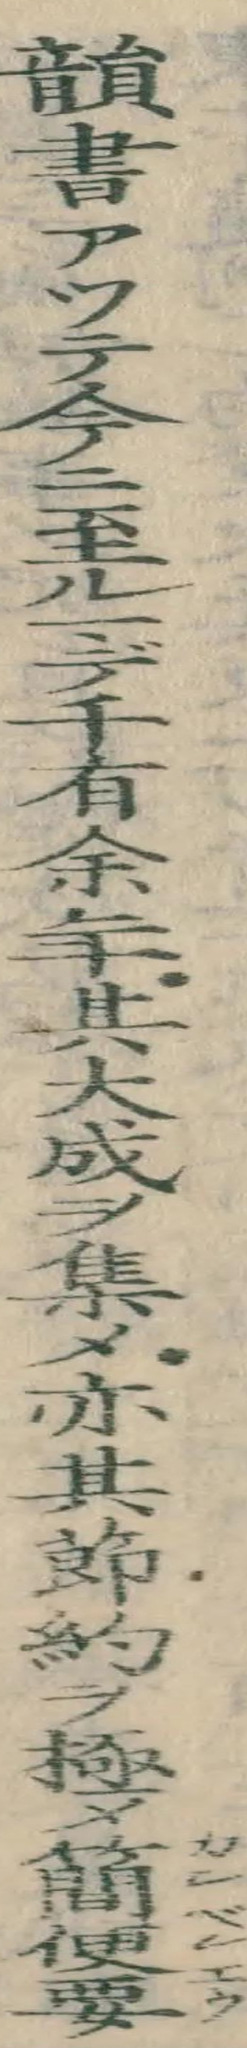韻書アツテ今ニ至ルマデ千有余年．其大成ヲ集メ．亦其節約ヲ極メ簡便要
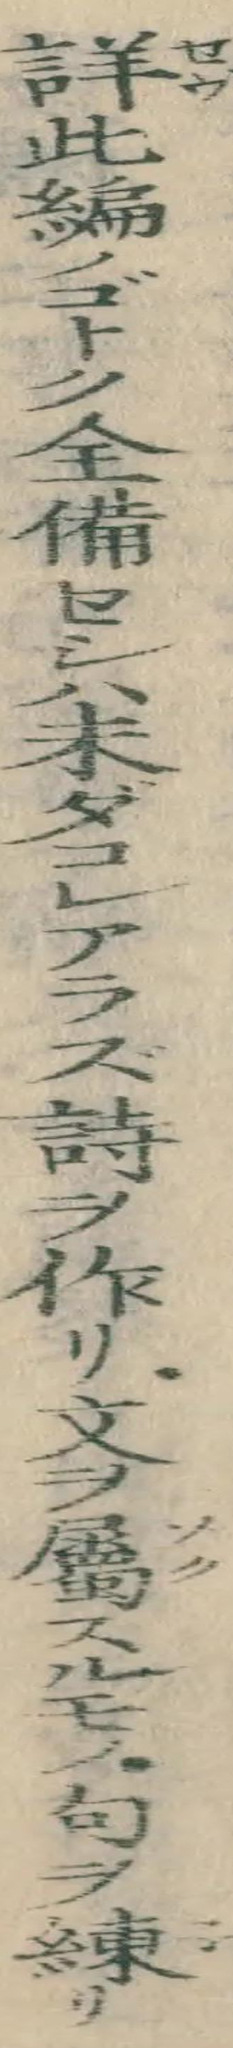詳此編ノゴトク全備セシハ未ダコレアラズ詩ヲ作リ．文ヲ属スルモノ．句ヲ練リ
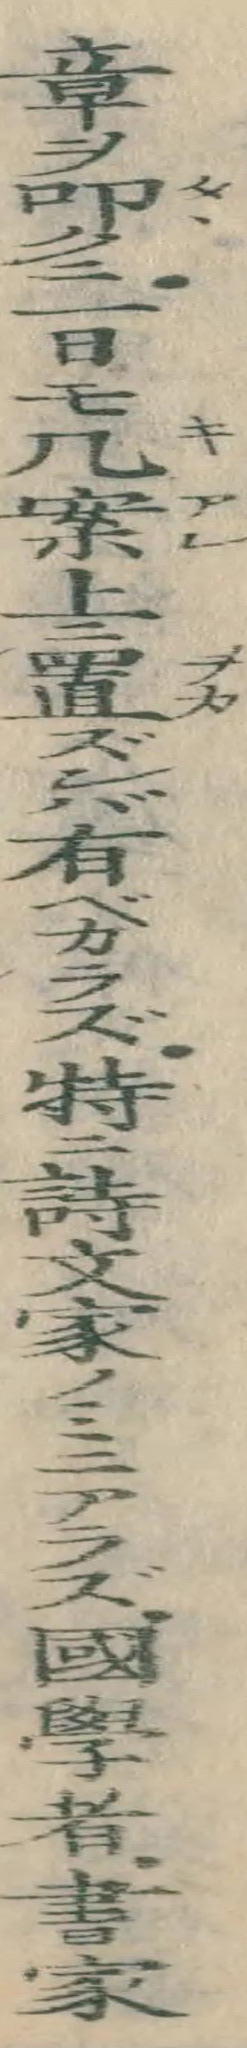章ヲ叩クニ．一日モ几案上ニ置ズンバ有ベカラズ．特ニ詩文家ノミニアラズ．国学者．書家
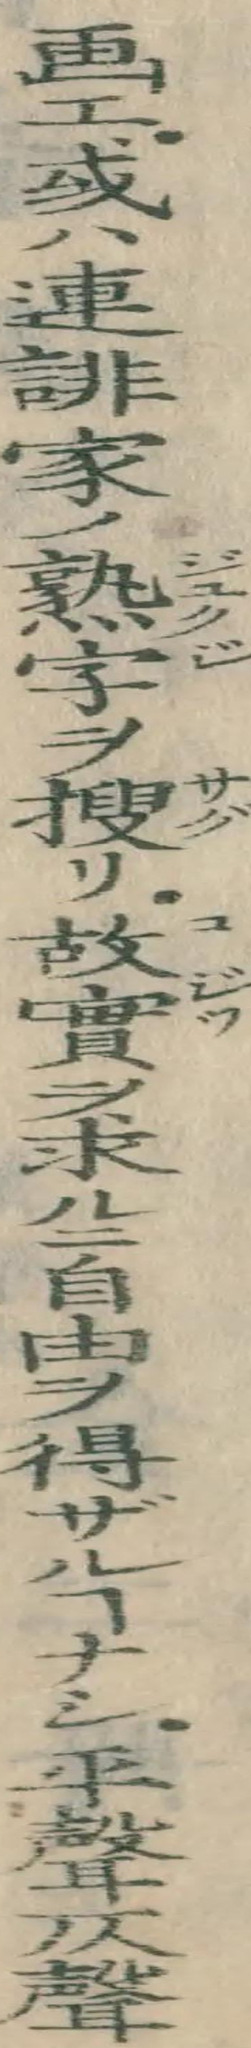画工．或ハ連誹家ノ熟字ヲ捜リ．故実ヲ求ルニ自由ヲ得ザルコトナシ．平声仄声
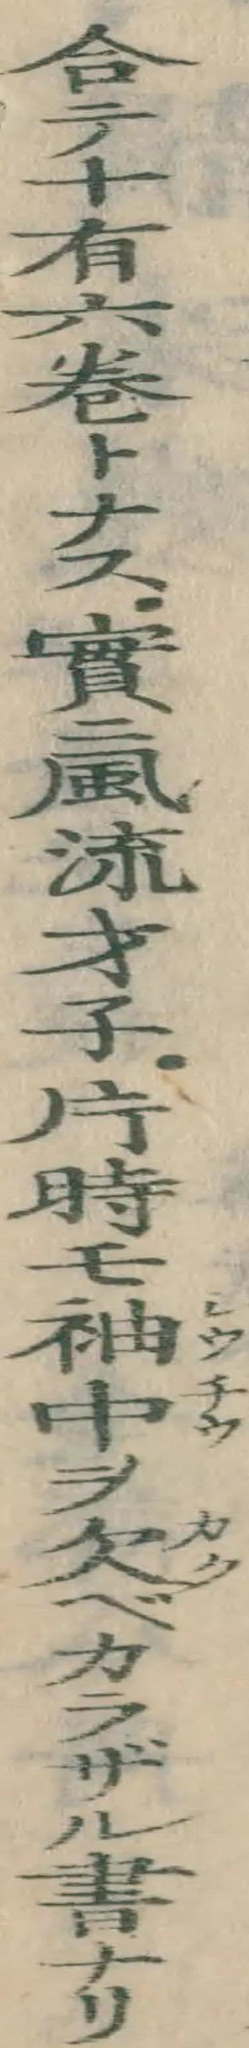合テ十有六巻トナス．実ニ風流才子．片時モ袖中ヲ欠ベカラザル書ナリ

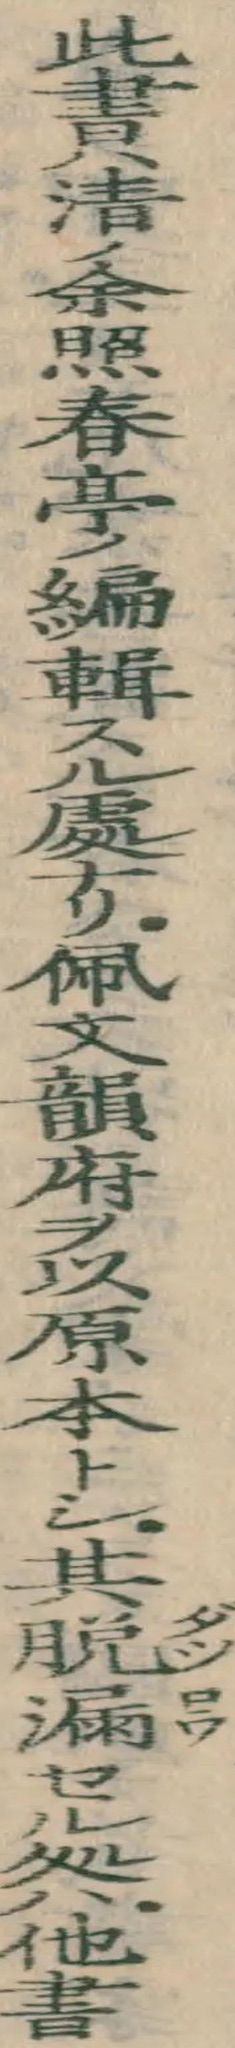此書ハ清ノ余照春亭ノ編輯スル処ナリ．佩文韻府ヲ以原本トシ．其脱漏セル処ハ．他書
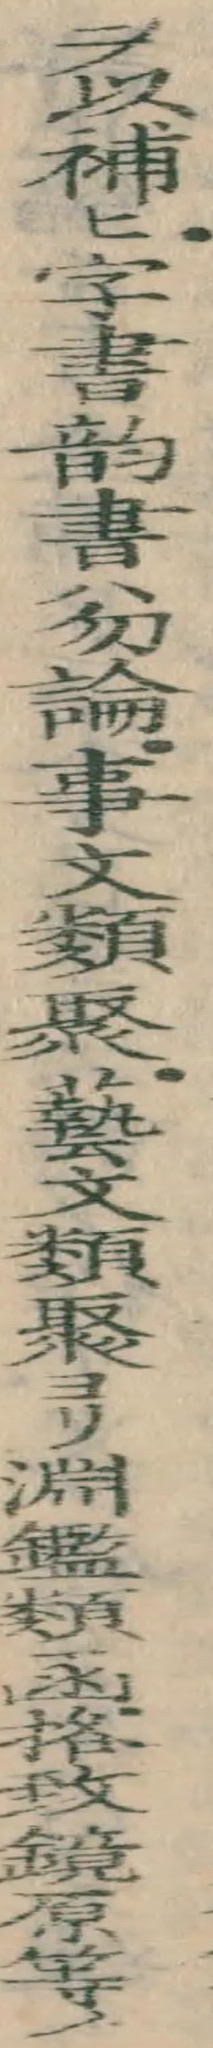ヲ以補ヒ．字書韵書ハ勿論．事文類聚．芸文類聚ヨリ淵鑑類函．格致鏡原等ノ
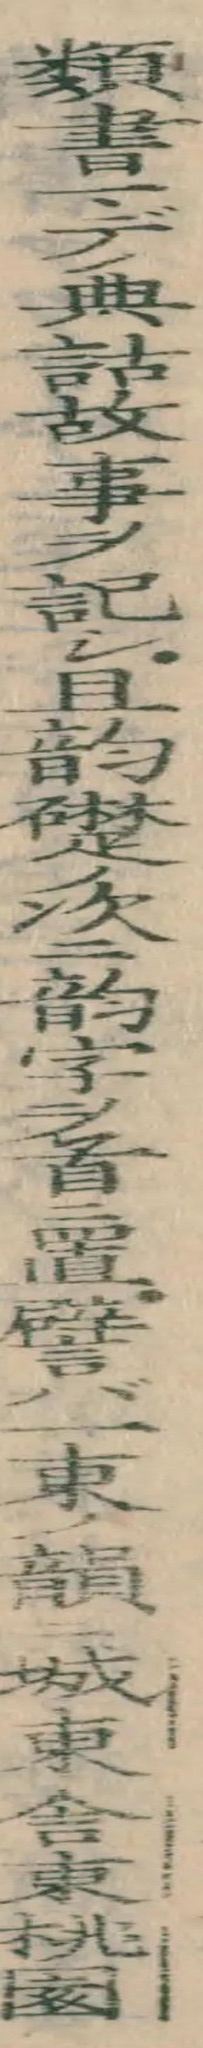類書マデノ典詁故事ヲ記シ．且韵礎ノ次ニ韵字ヲ首ニ置．譬バ一東ノ韻ニ城東舎東桃園
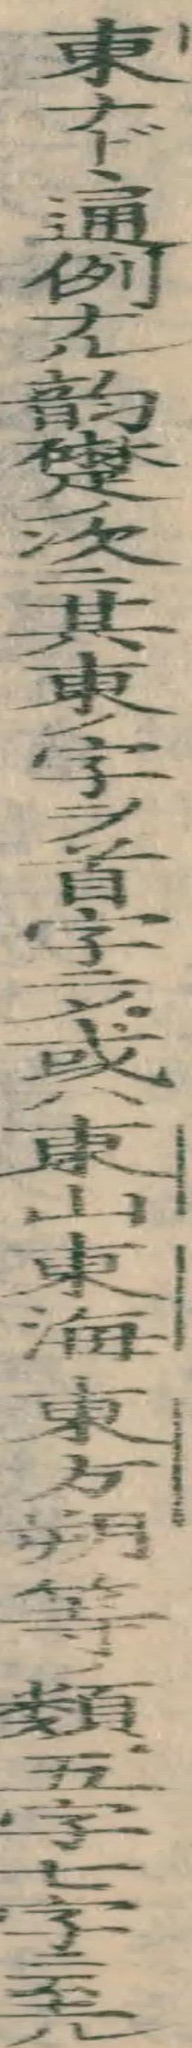東ナドヽ通例ナル韵礎ノ次ニ其東ノ字ヲ首字ニシテ．或ハ東山東海東方朔等ノ類．五字七字ニ至ル
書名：これこれ草 2巻. [2]
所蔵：国立国会図書館 National Diet Library, JAPAN
